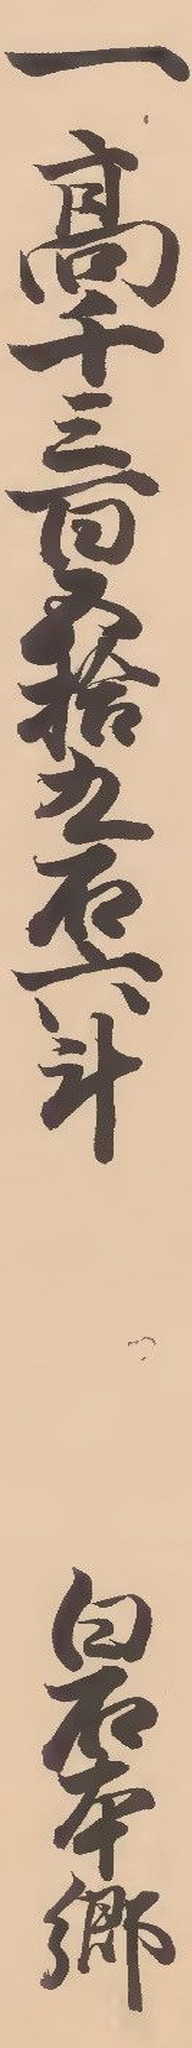一高千三百五拾九石六斗白石本郷
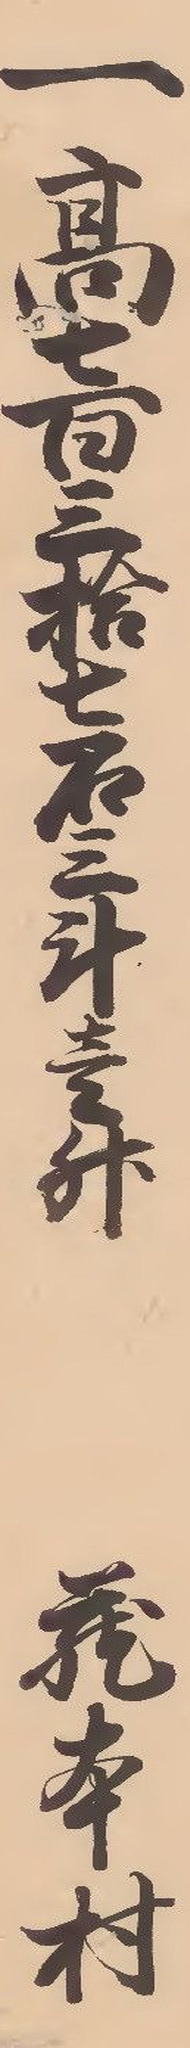一高七百三拾七石三斗壱升蔵本村

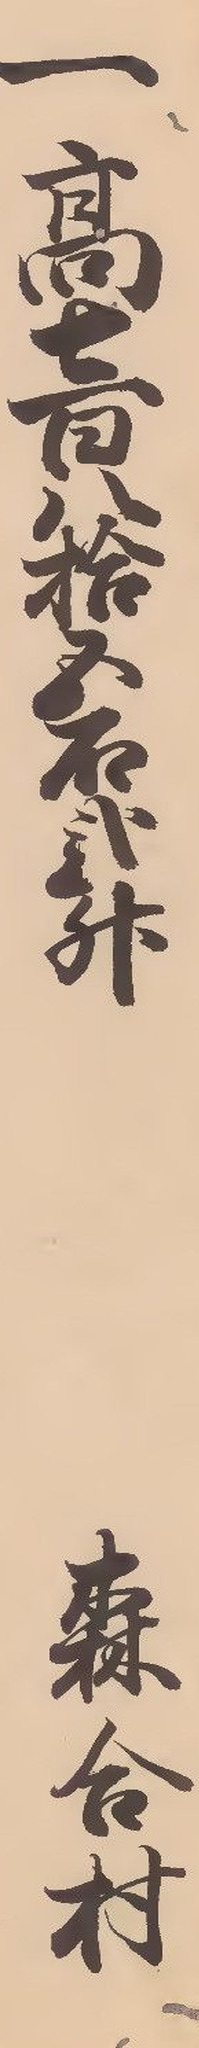一高七百八拾五石弐升森合村
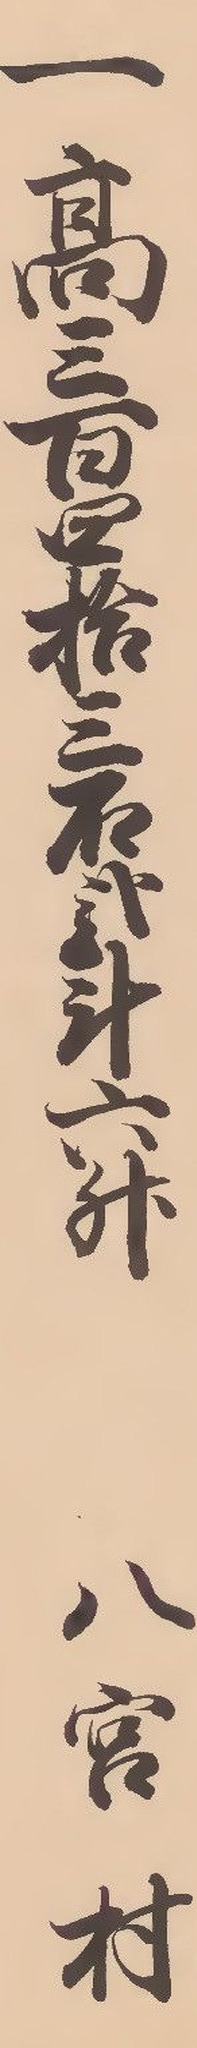一高三百四拾三石弐斗六升八宮村
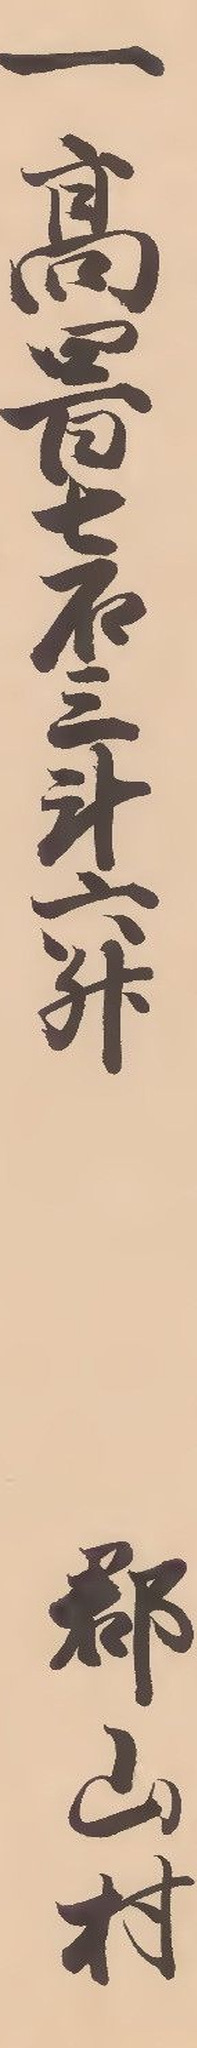一高四百七石三斗六升郡山村
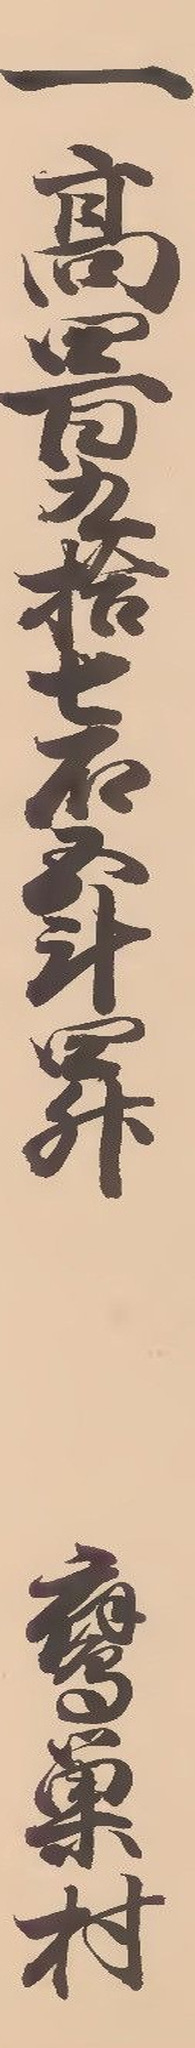一高四百九拾七石五斗四升鷹巣村
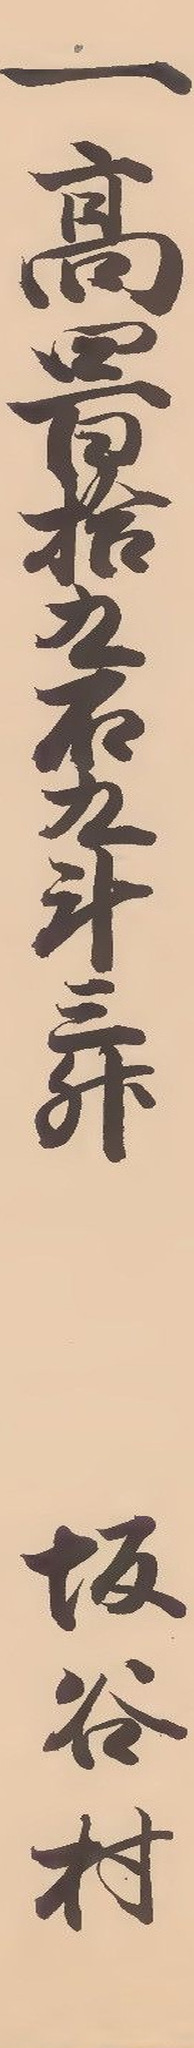一高四百拾九石九斗三升坂谷村
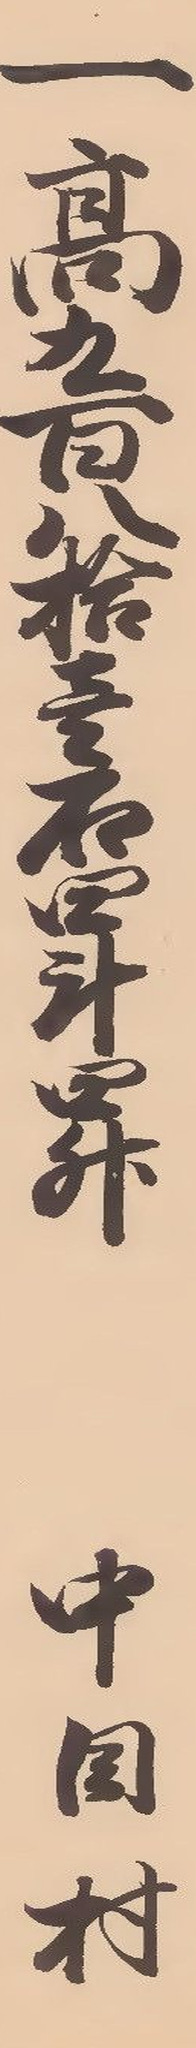一高九百八拾壱石四斗四升中目村
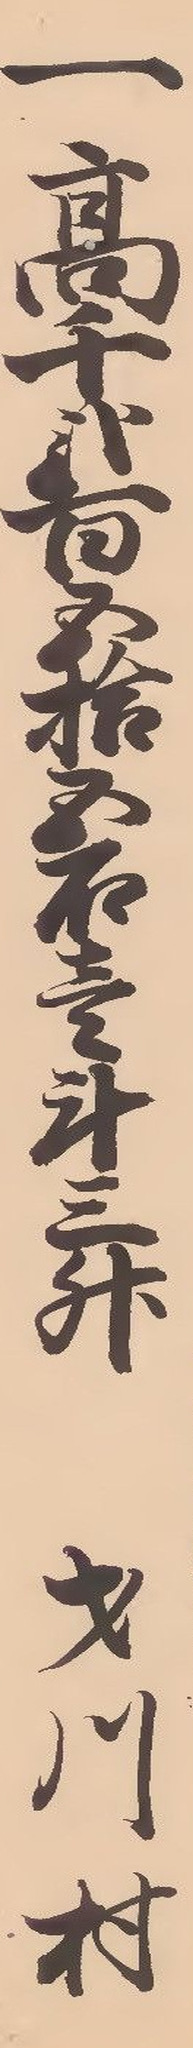一高千弐百五拾五石壱斗三升才川村

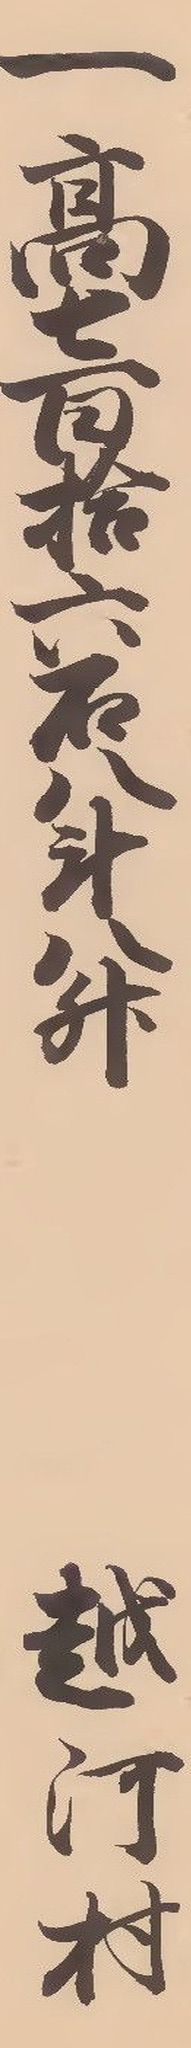一高七百拾六石八斗八升越河村
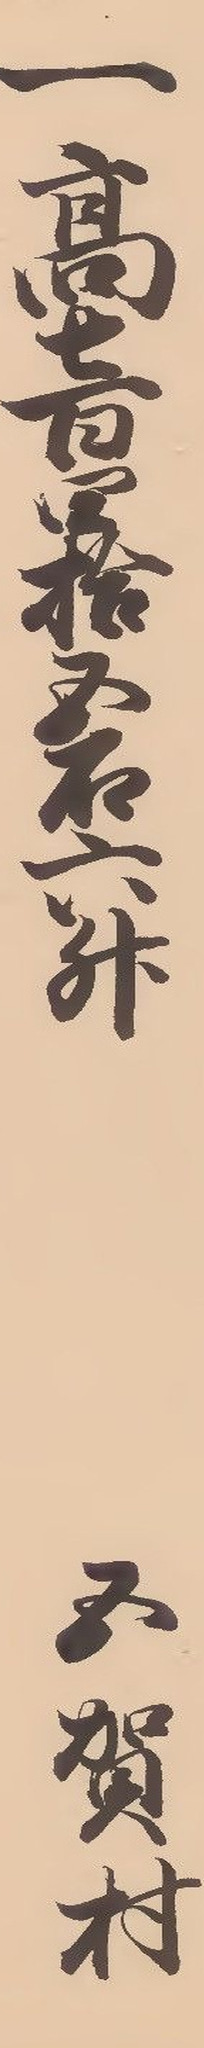一高七百四拾五石六升五賀村
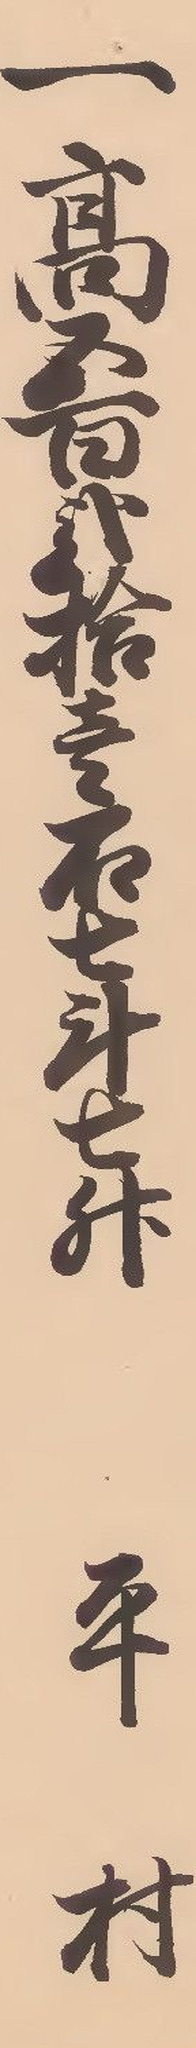一高五百弐拾壱石七斗七升平村
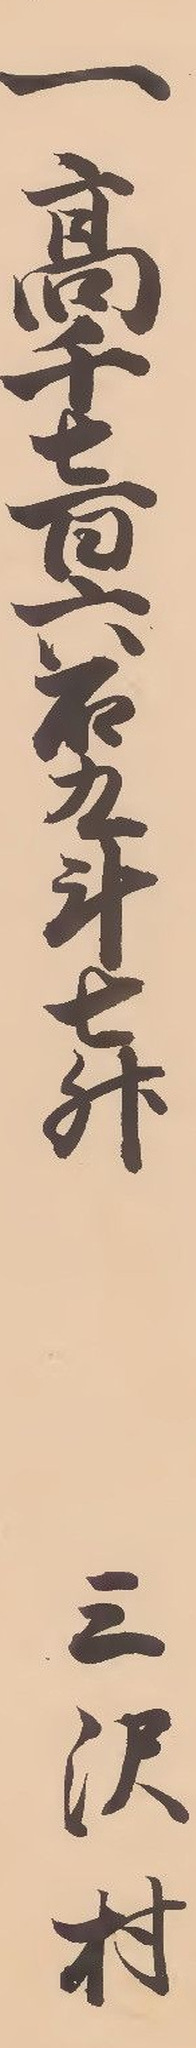一高千七百六石九斗七升三沢村
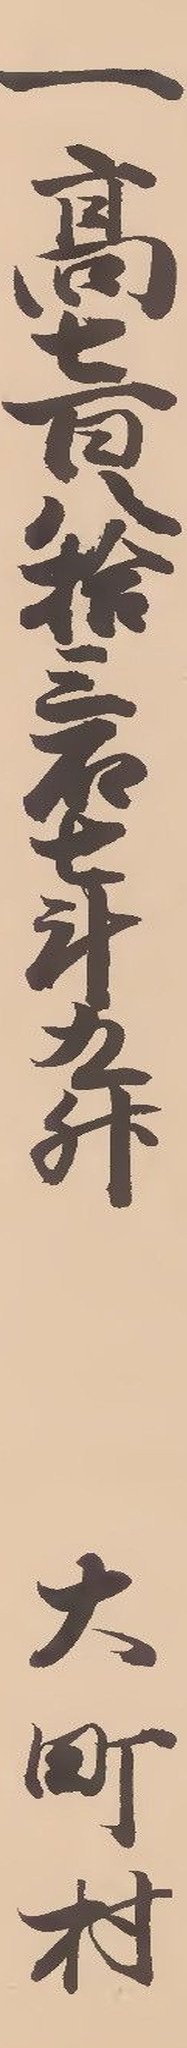一高七百八拾三石七斗九升大町村
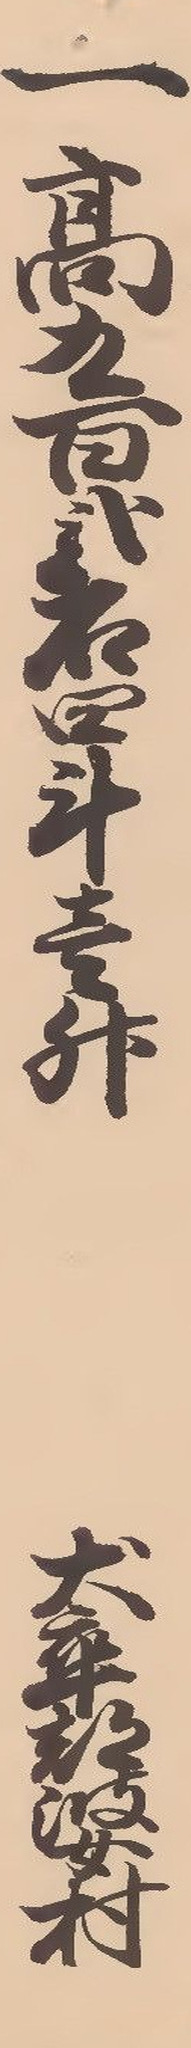一高九百弐石四斗壱升犬卒都婆村
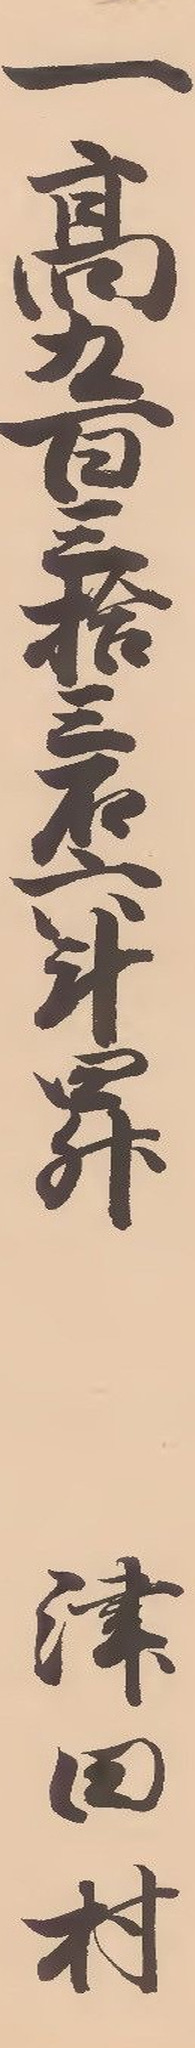一高九百三拾三石六斗四升津田村
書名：陸奥国郷帳　５
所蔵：国立公文書館 National Archives of Japan
